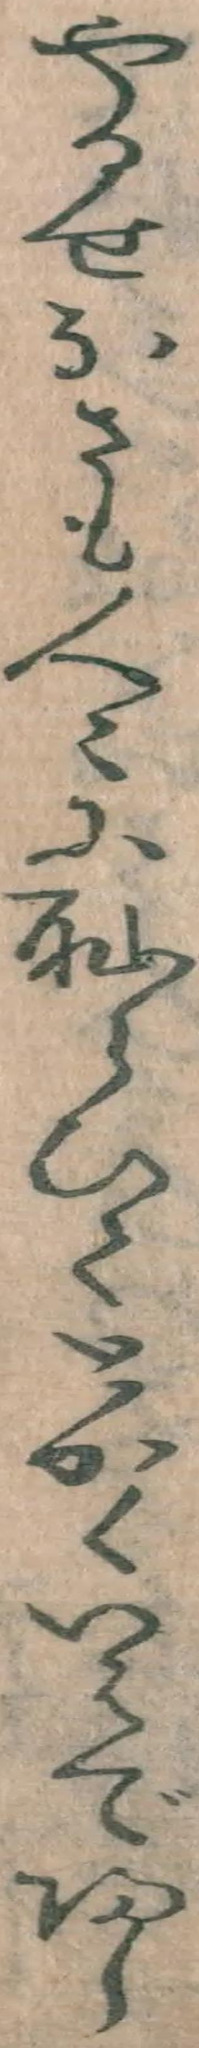やるせなさも人々に恥らひてとかくいはで帰し
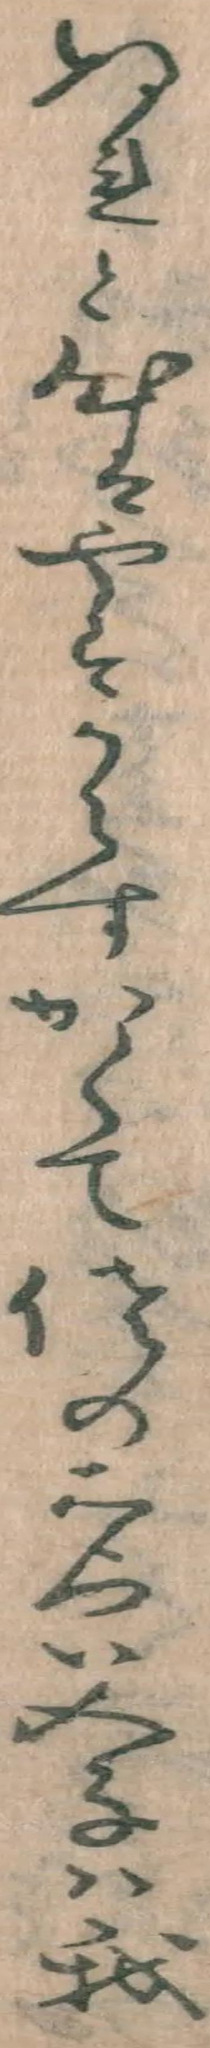ぬれと心はやすからすかくて佐の右衛門父子は我
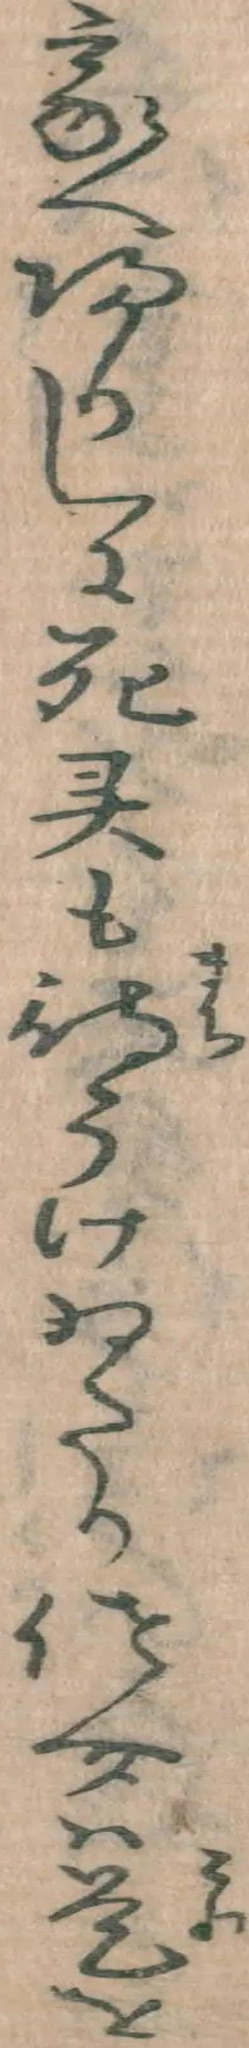家へ帰りしに死霊も待うけゐたり佐介は是を
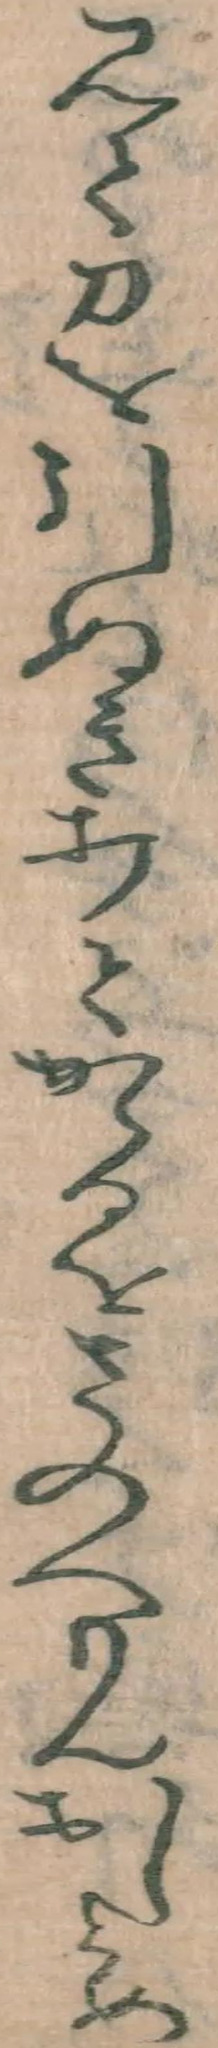見て刀を引ぬき打てかゝるをさのへもんおしとめ
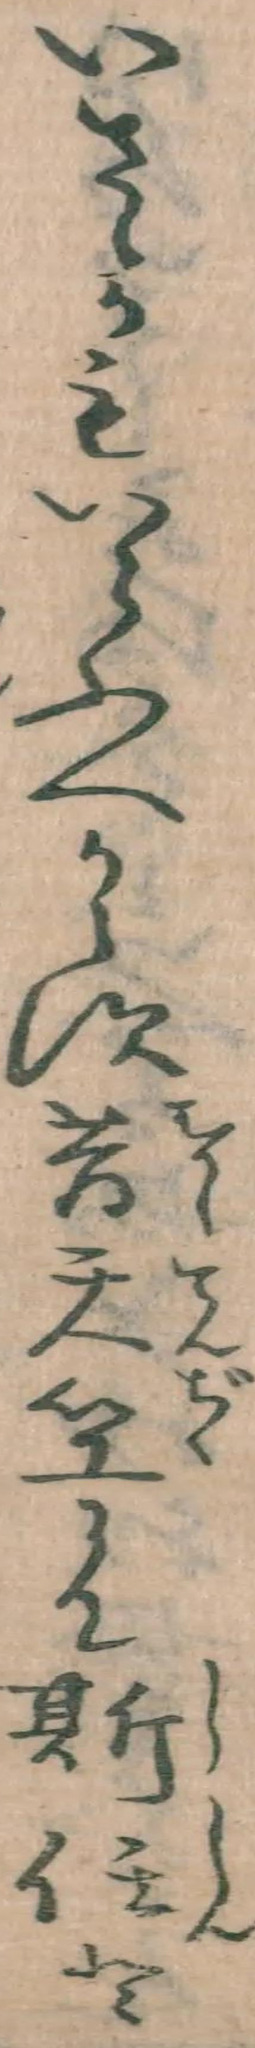いさゝかもいらふへからす昔天竺にて斯任と
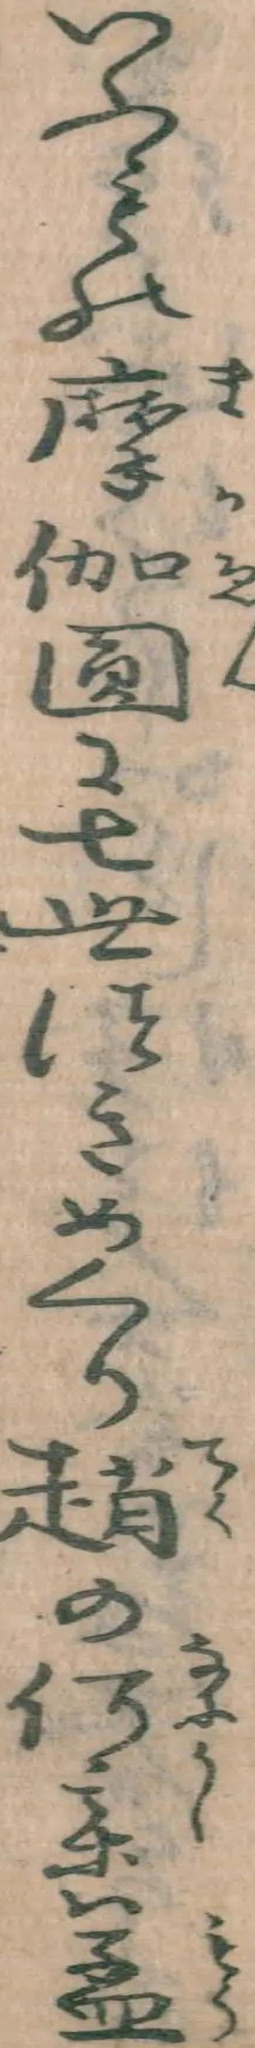いふもの摩伽圓に七世つきめくり趙の何某は孟
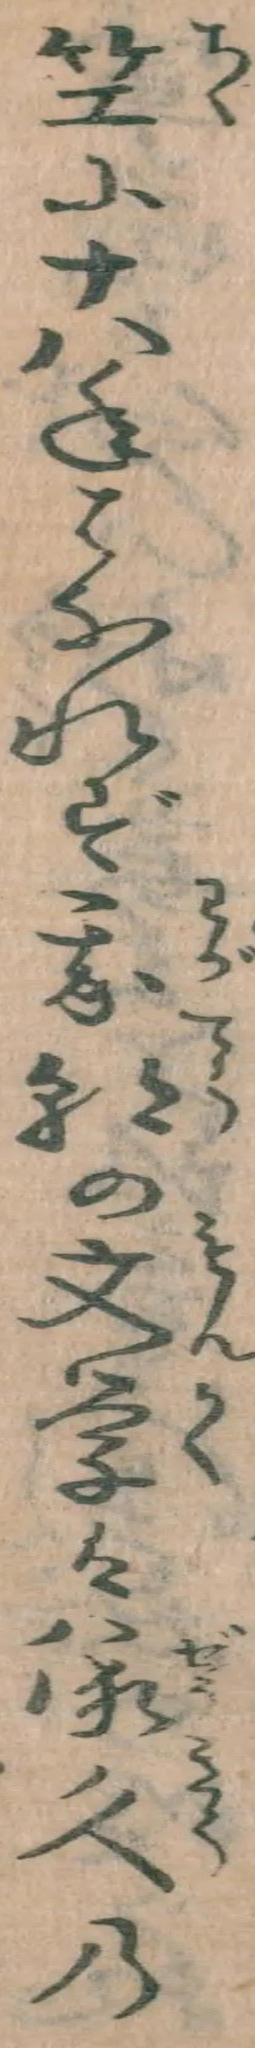竺に十八年はなれず我朝の文学は承久の
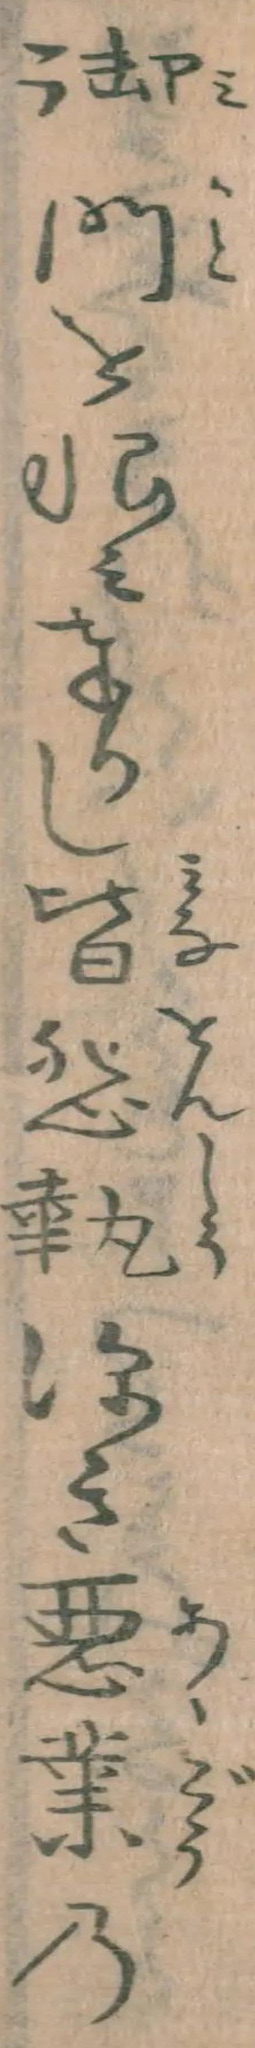御門を恨み奉りし皆怨執深き悪業の
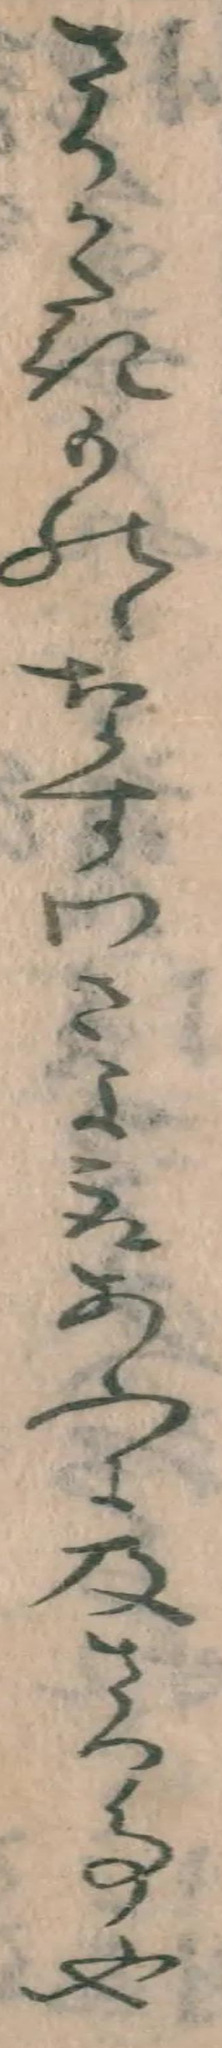さりかたきものゝなすわさに取あふに及さる事や
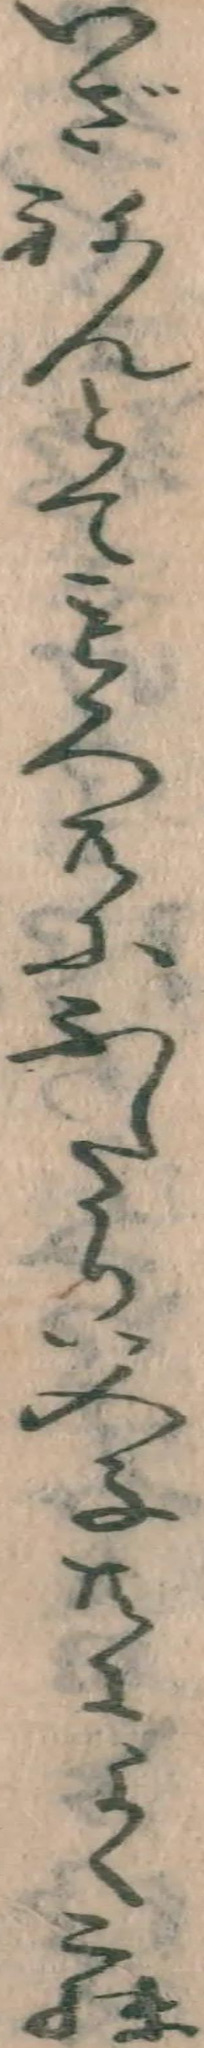いざねんとてもろ共にふしたり父子共によく寝
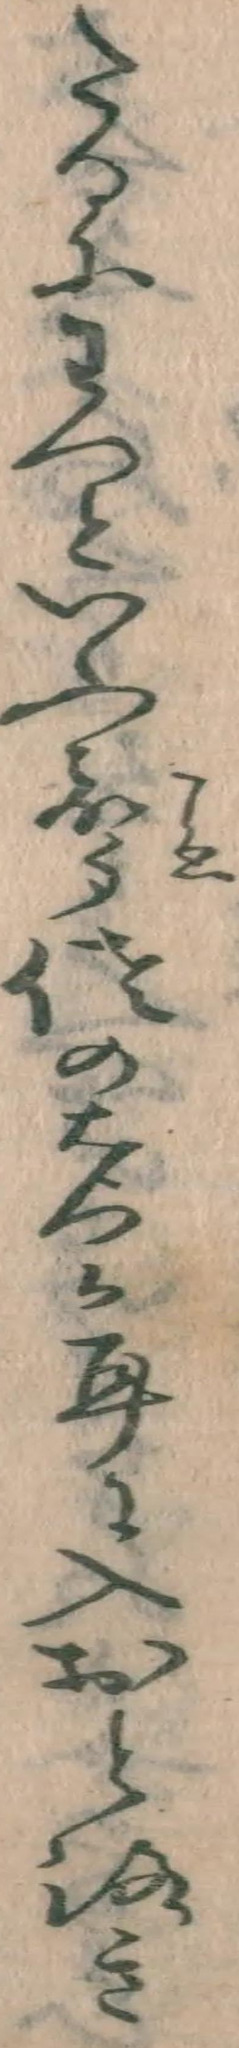たるにわつといふ声佐の右衛門か耳に入おとろき
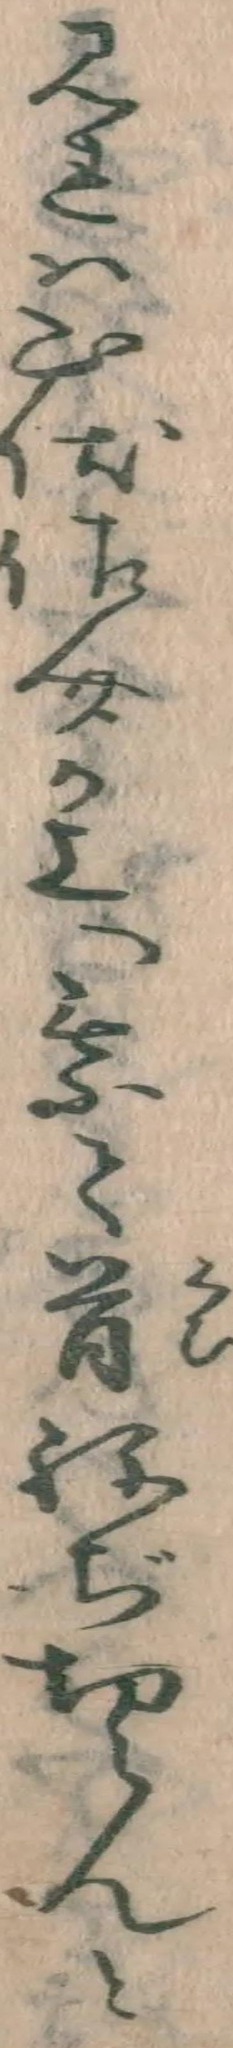見れは山伏佐介か上へ乗て首ねぢ切らんと
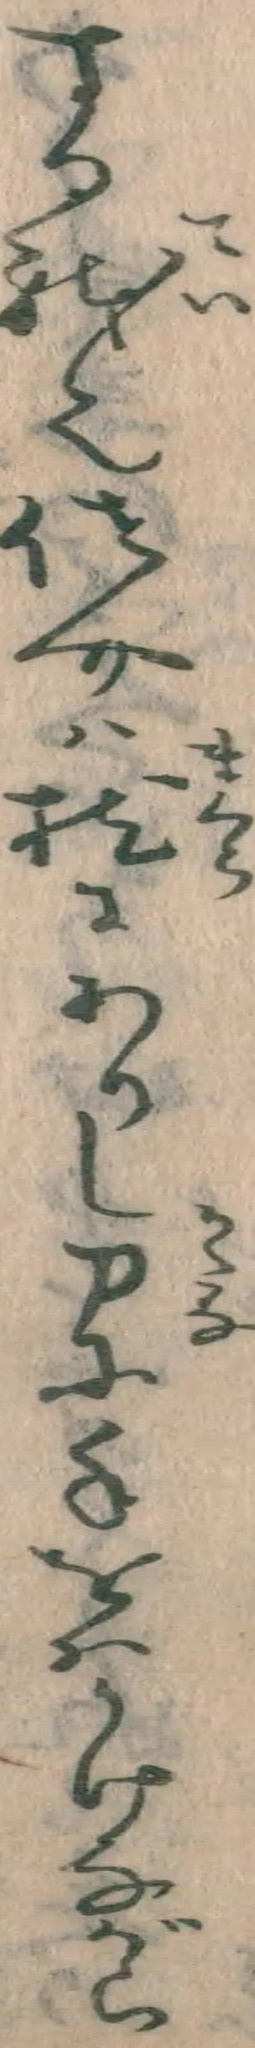する体也佐介は枕にありし刀に手をはかけながら
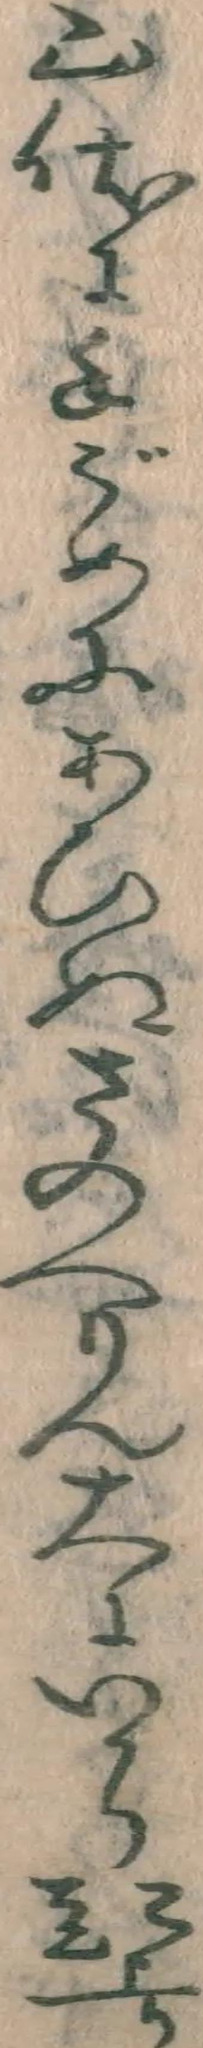山伏に手ごめにあひぬさのへもん大にいかり起上り
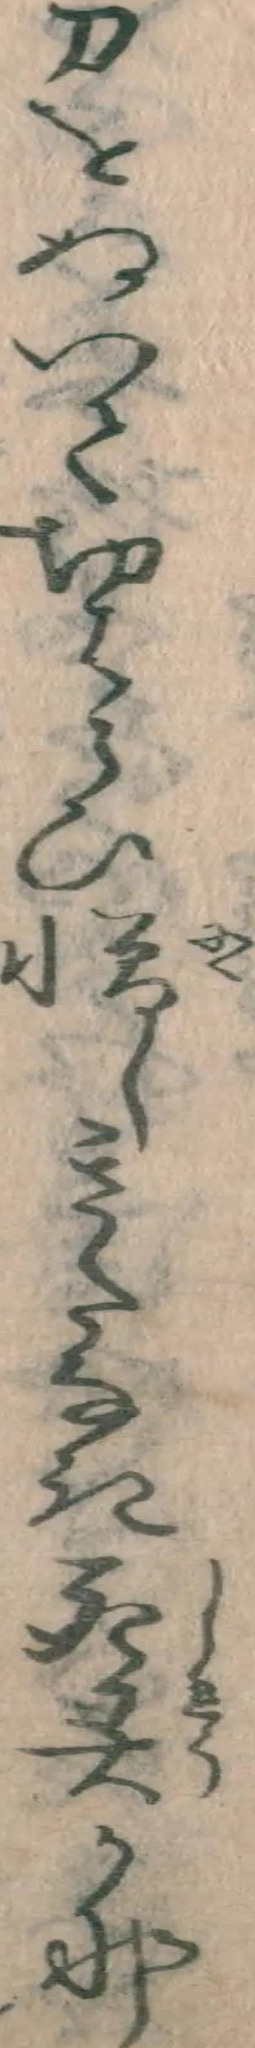刀をぬいて切はらひ憎しきたなき死霊かな
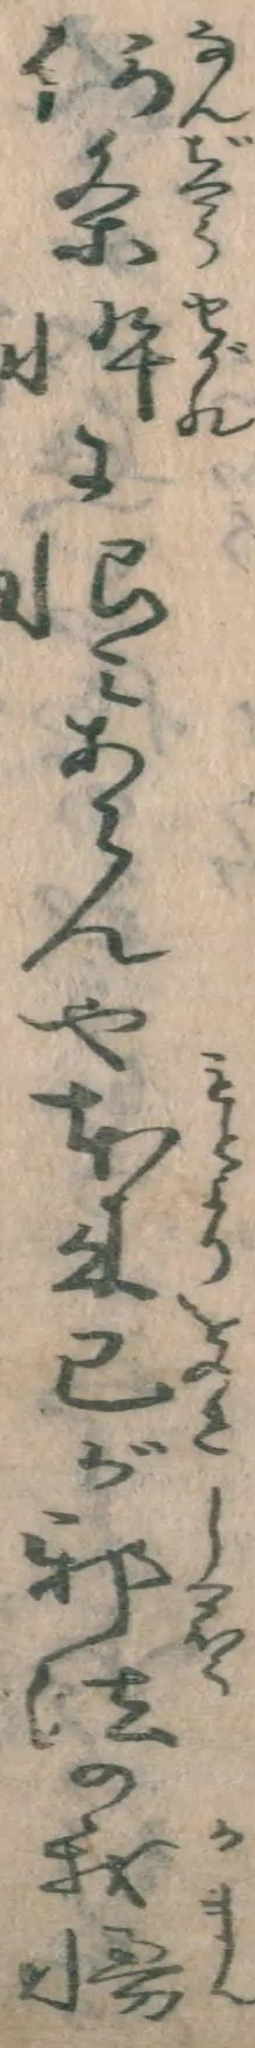何条伜に恨みあらんや本来己が邪法の我慢
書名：怪談御伽童 5巻. [2]
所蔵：国立国会図書館 National Diet Library, JAPAN
